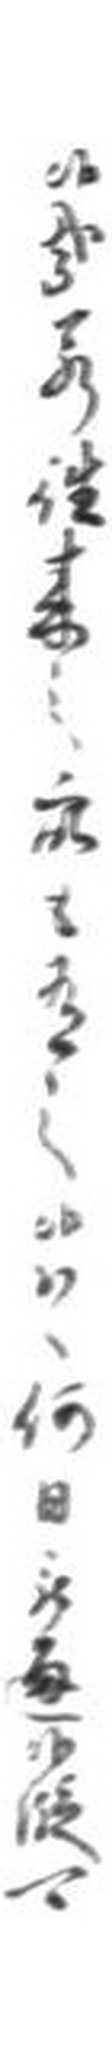候哉若往来之衆も有之候ハヽ何日被通候段可

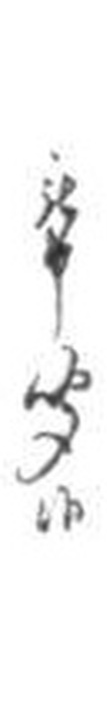被申聞候
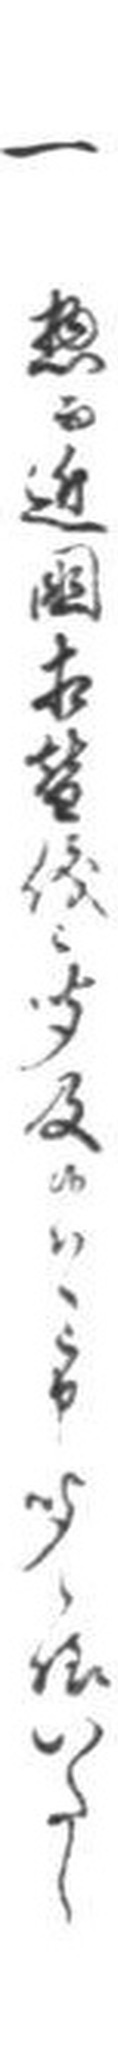一惣而近国相替儀被聞及候ハヽ被申聞候様いたし
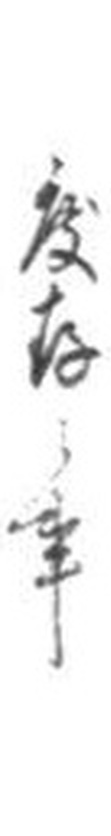度存候事
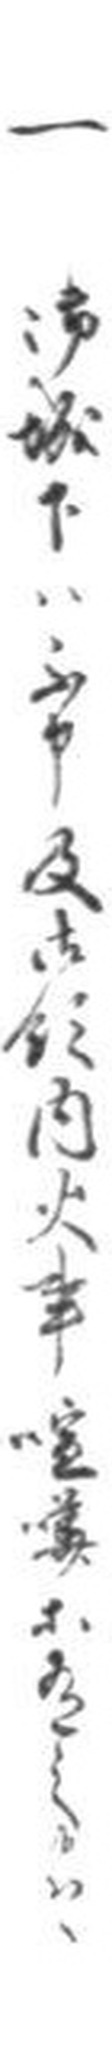一御城下ハ不申及御領内火事喧嘩等有之候ハヽ
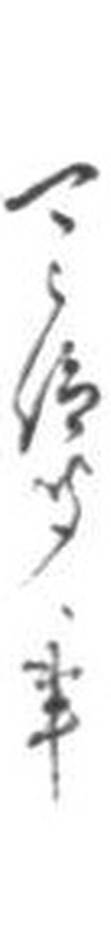可被仰聞候事
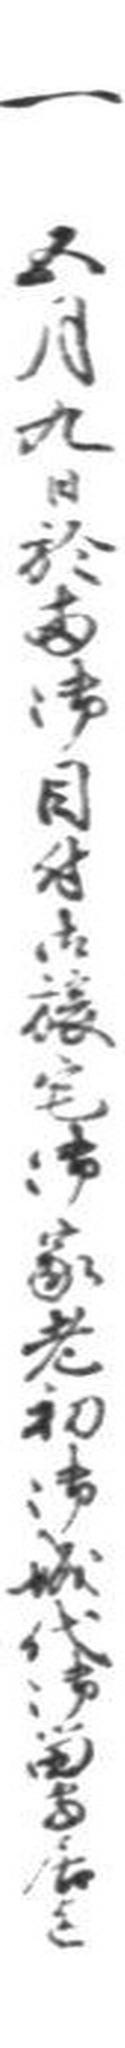一五月九日於両御目付御旅宅御家老初御城代御留守居迄
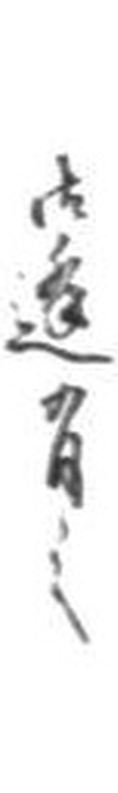御逢有之
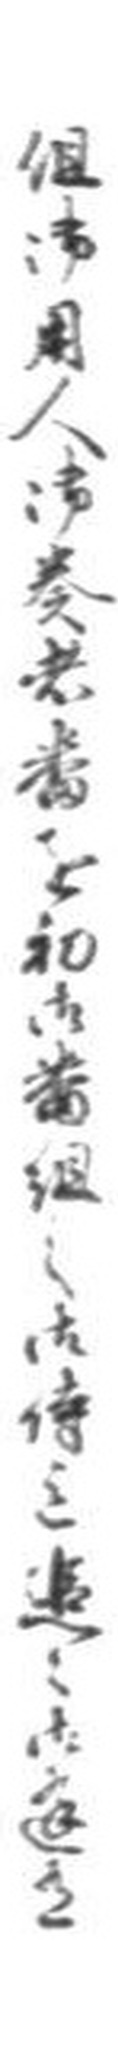但御用人御奏者番を初御番組之御侍迄追々御逢有
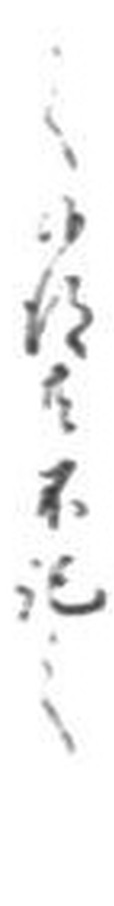之候得共不記之
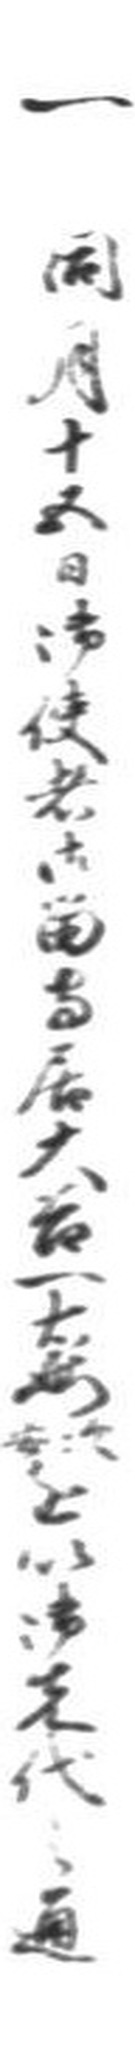一同月十五日御使者御留守居大谷一右衛門次安を以御先代之通
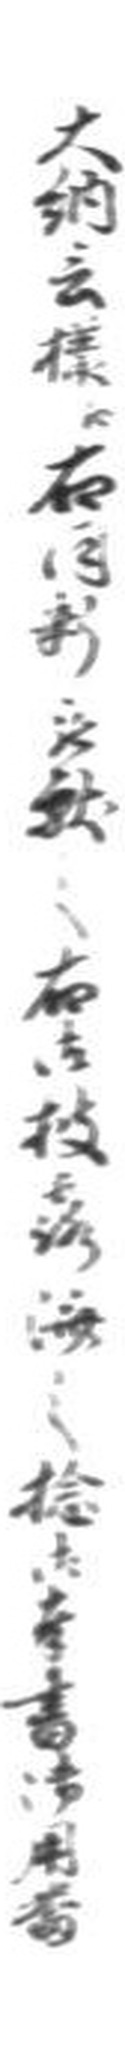大納言様江右同断被献之右御披露済之捻御奉書御用番
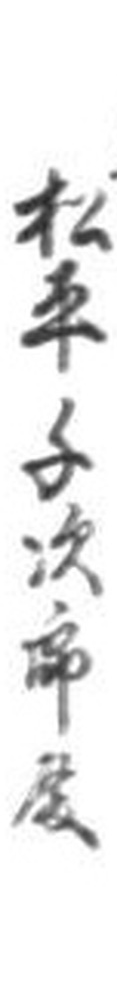松平千次郎殿乗邑
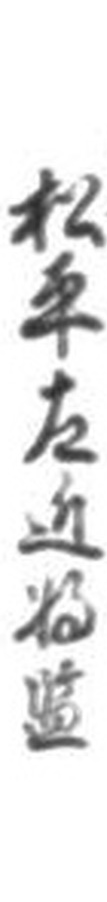松平左近将監

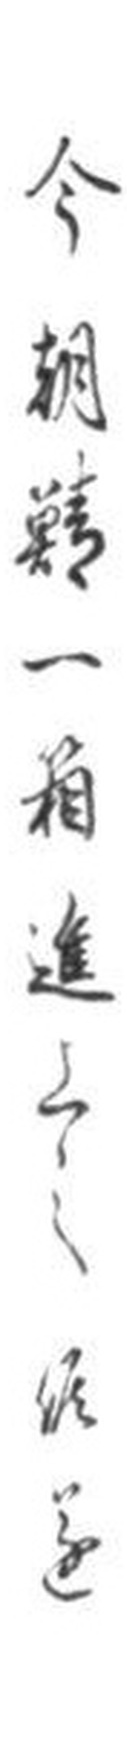今朝鯖一箱進上之候遂
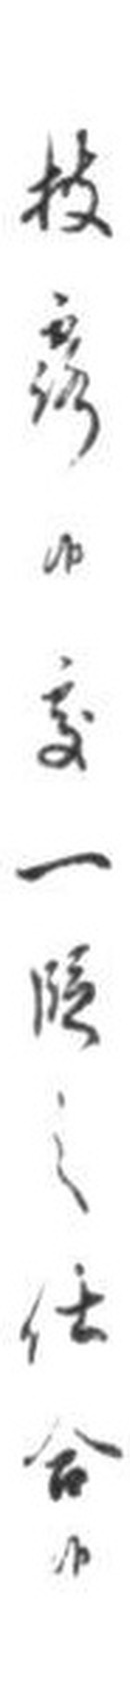披露候処一段之仕合候
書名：家譜 三十九 宗矩公 享保十年
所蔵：福井県文書館 Fukui Prefectural Archives
